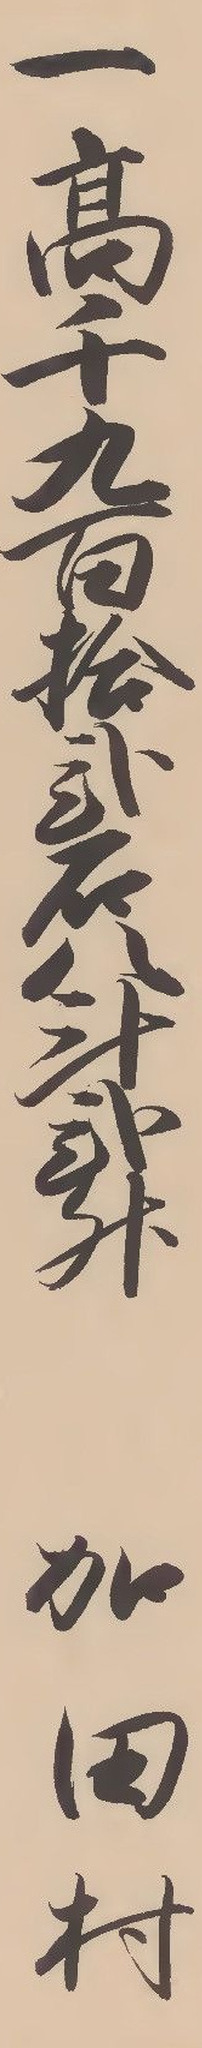一高千九百拾弐石八斗弐升加田村
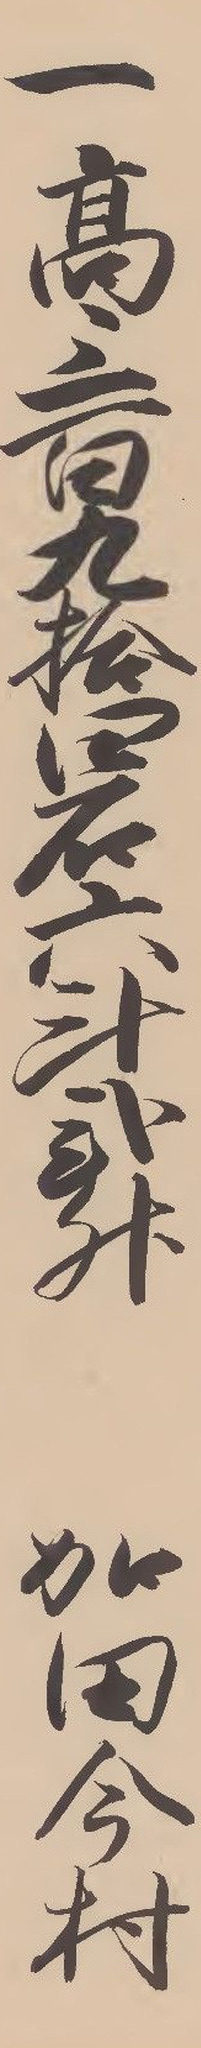一高三百九拾四石六斗弐升加田今村
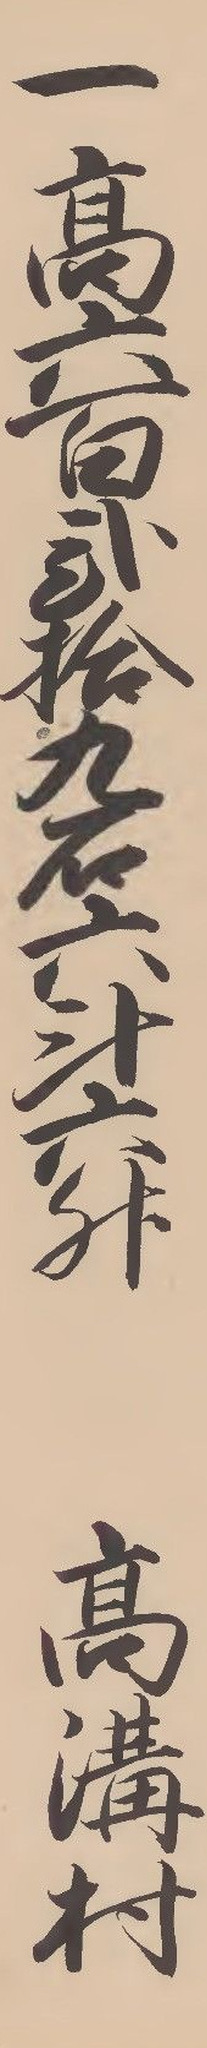一高六百弐拾九石六斗六升高溝村

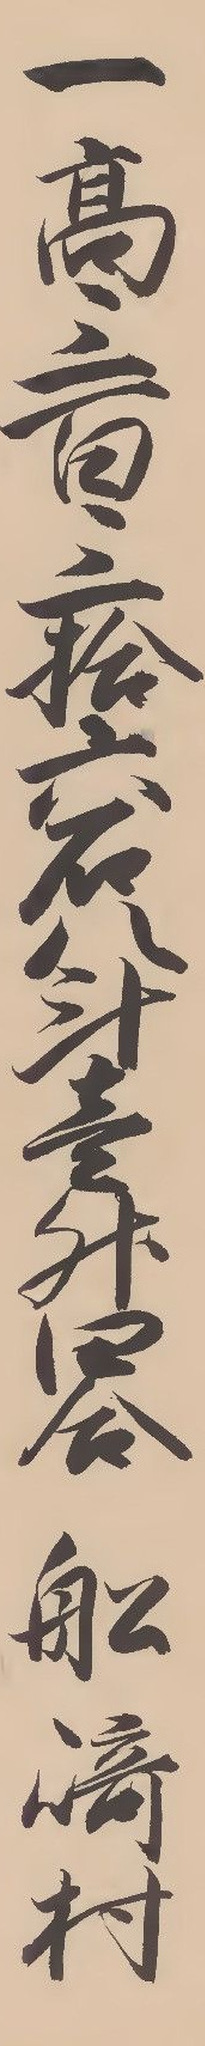一高三百三拾六右八斗壱升四合船崎村
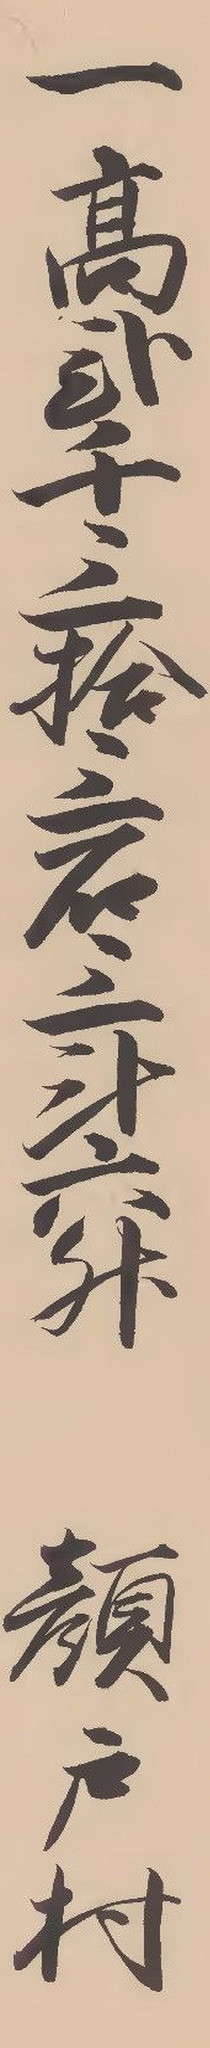一高弐千三拾三石三斗六升顔戸村
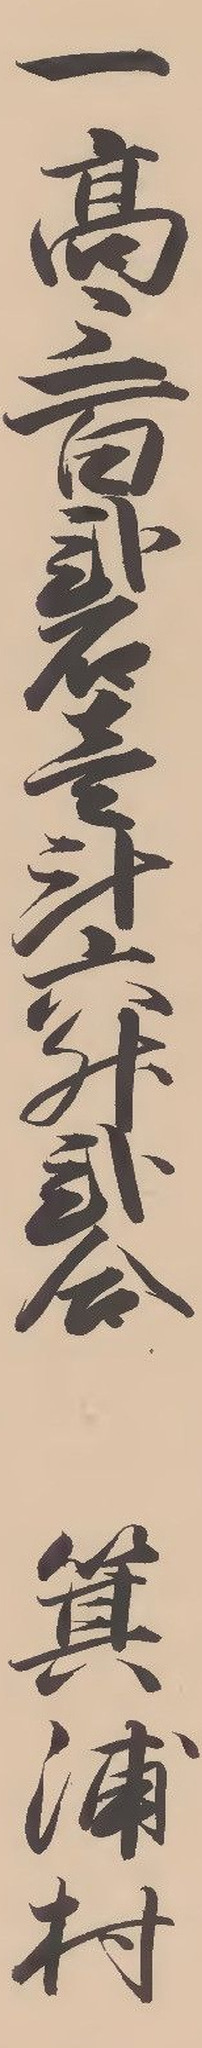一高三百弐石壱斗六升弐合箕浦村
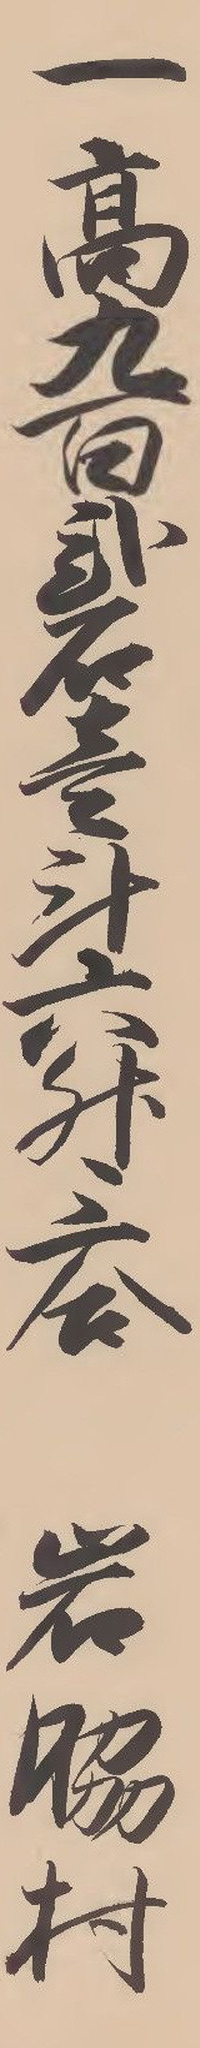一高九百弐石壱斗六升三合岩脇村
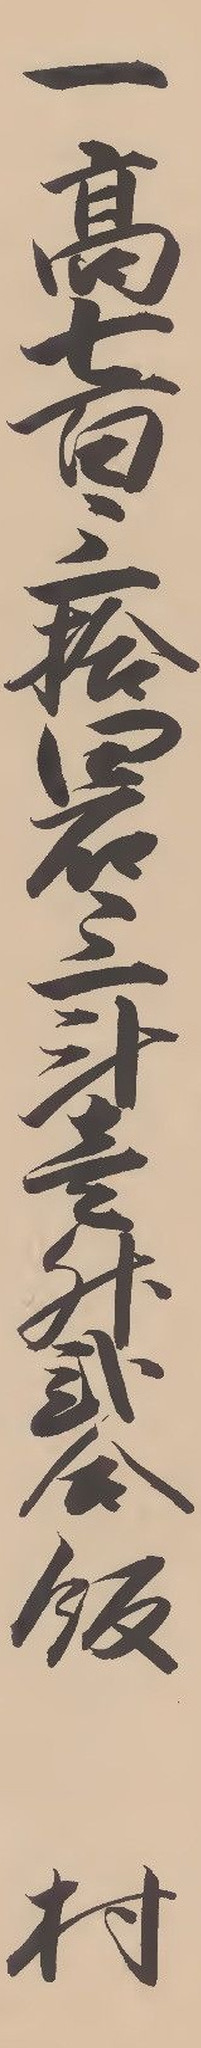一高七百三拾四石三斗壱升弐合飯村
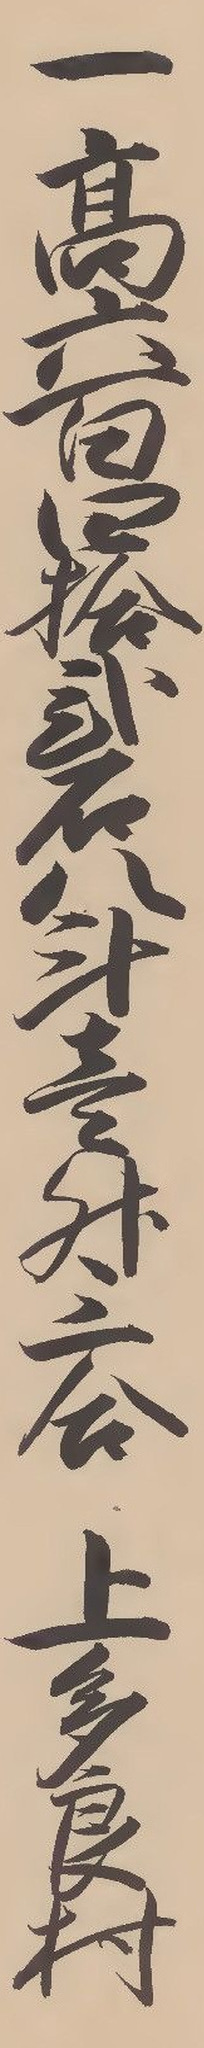一高六百四拾弐石八斗壱升三合上多良村
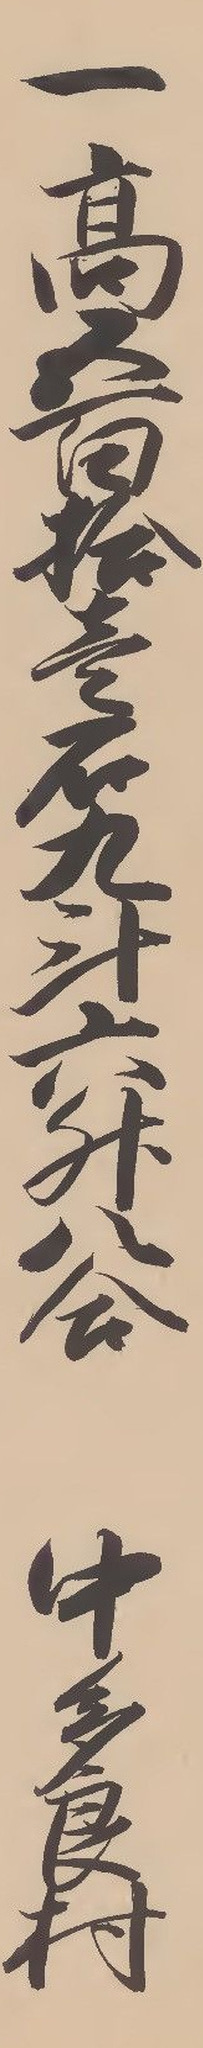一高五百拾壱石九斗六升八合中多良村
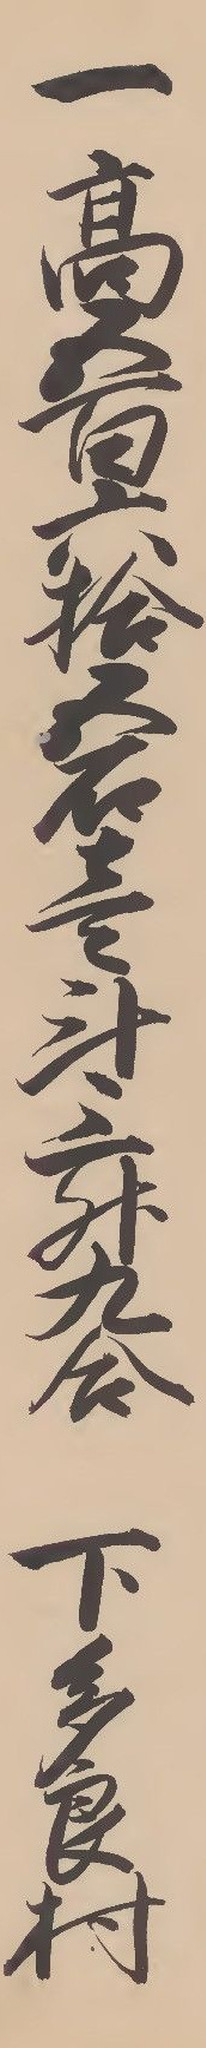一高五百六拾五石壱斗三升九合下多良村

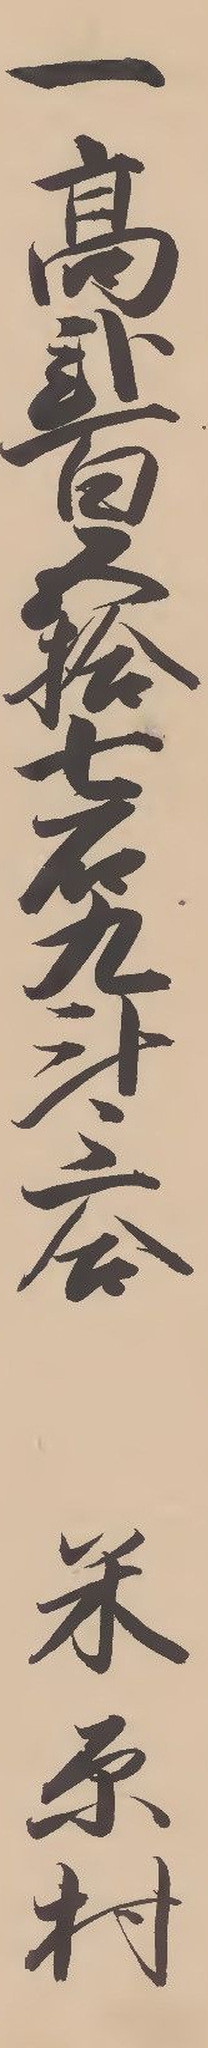一高弐百五拾七石九斗三合米原村
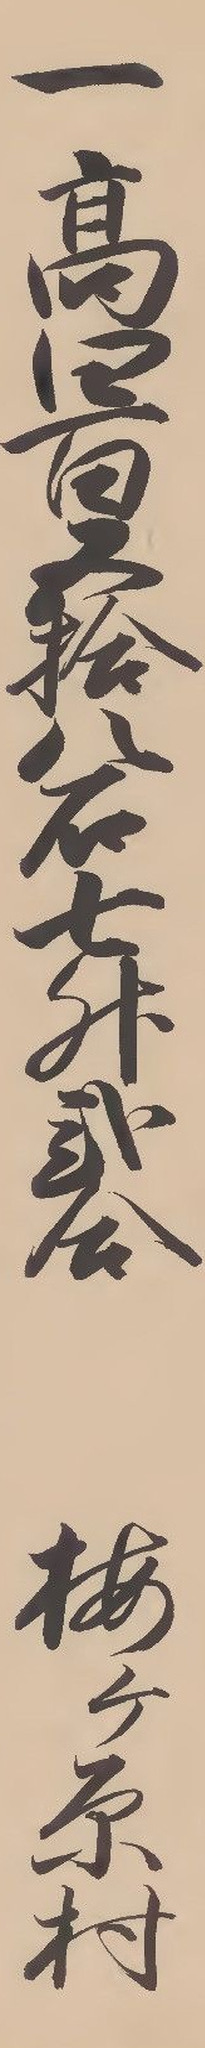一高四百五拾八石七升弐合梅ヶ原村
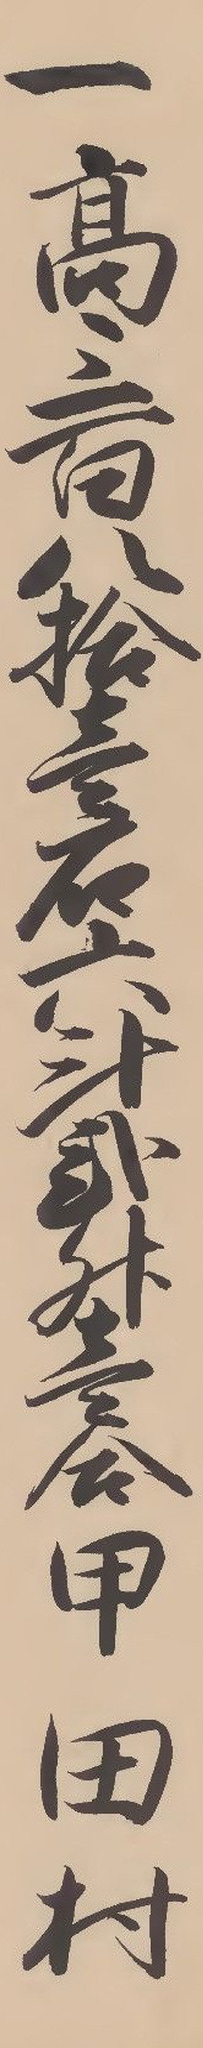一高三百八拾壱石六斗弐升壱合甲田村
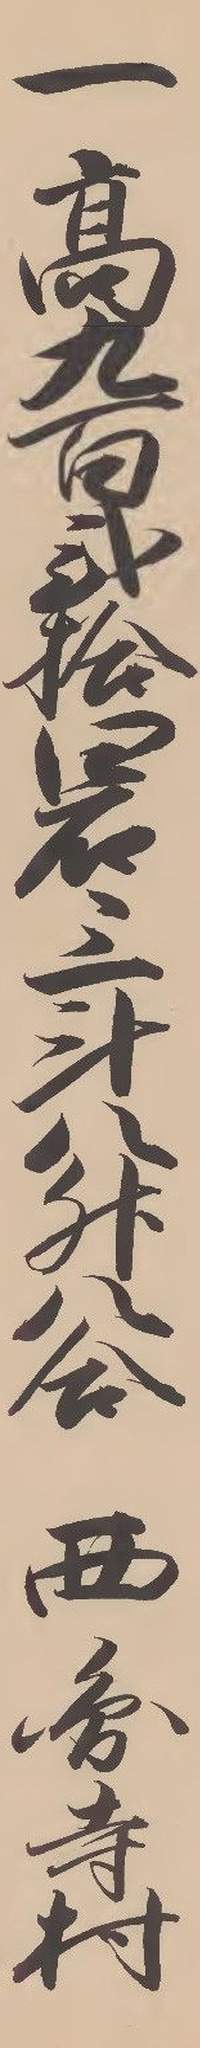一高九百弐拾四石三斗八升八合西円寺村
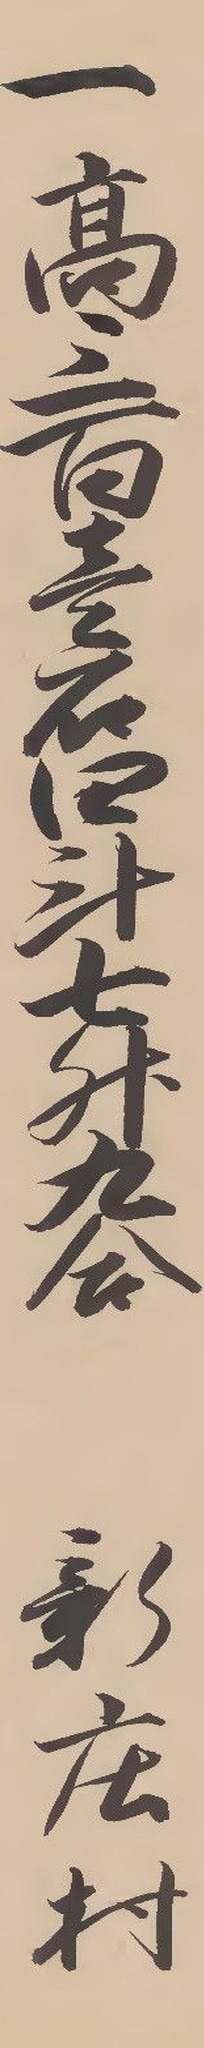一高三百壱石四斗七升九合新庄村
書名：近江国郷帳
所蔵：国立公文書館 National Archives of Japan
